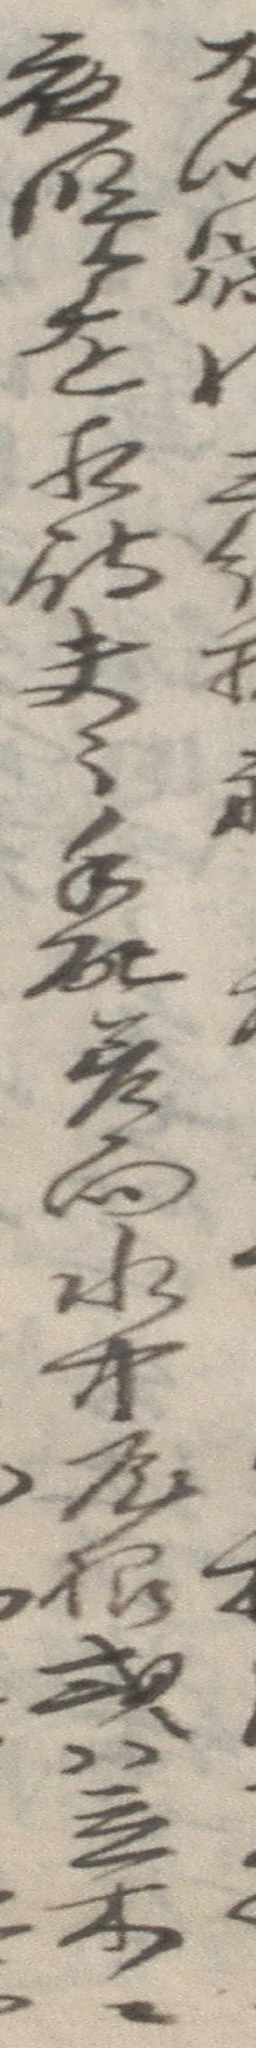夜明を相待夫々手配差向水中屋根或ハ立木二
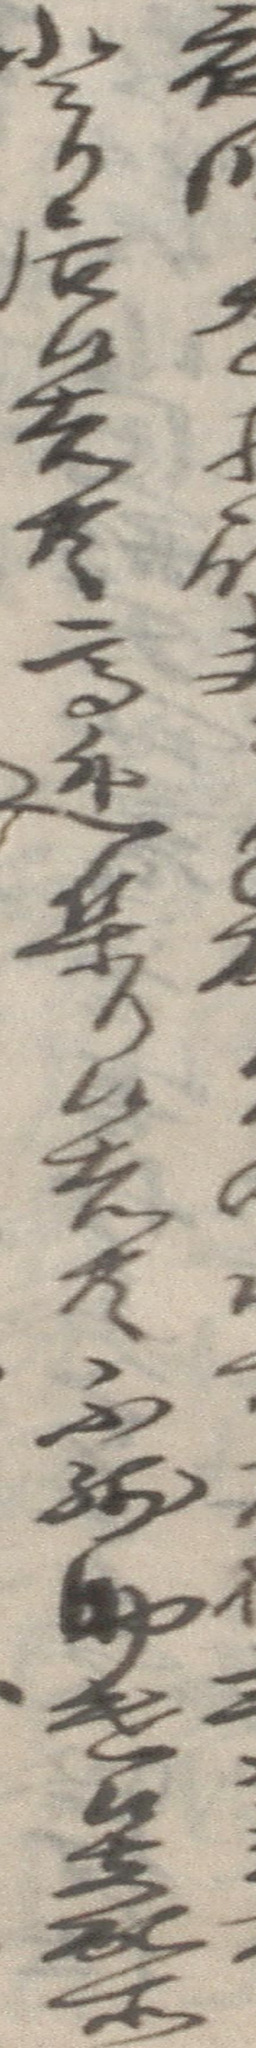登り居候者共高逃集り候者共不残助遣候支配所
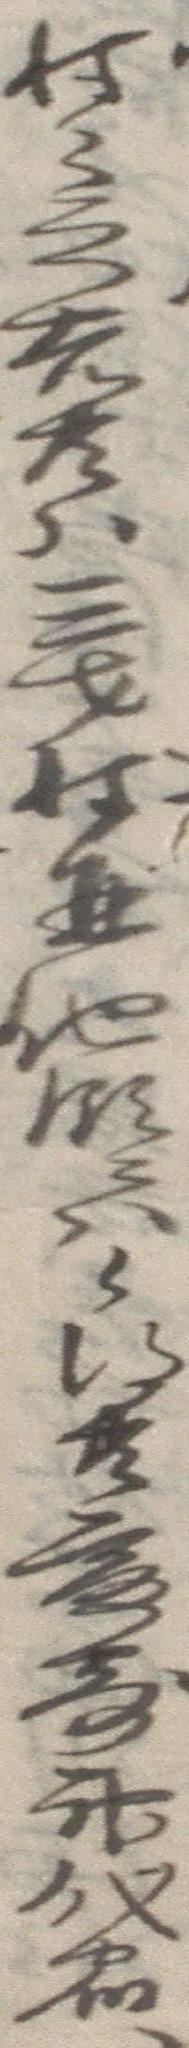村々之者共ハ三才村並他領二ハ候得共最寄神代宿へ
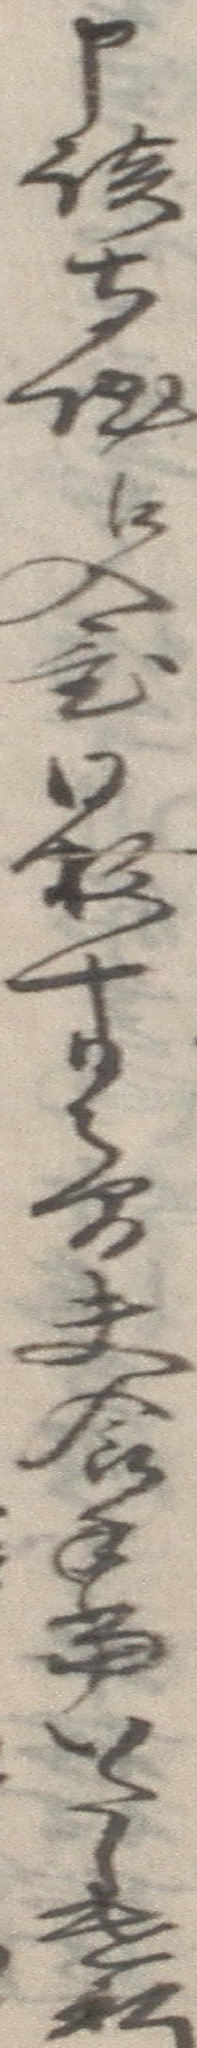申談寺院江入置日数十日之間夫食手当いたし遣私
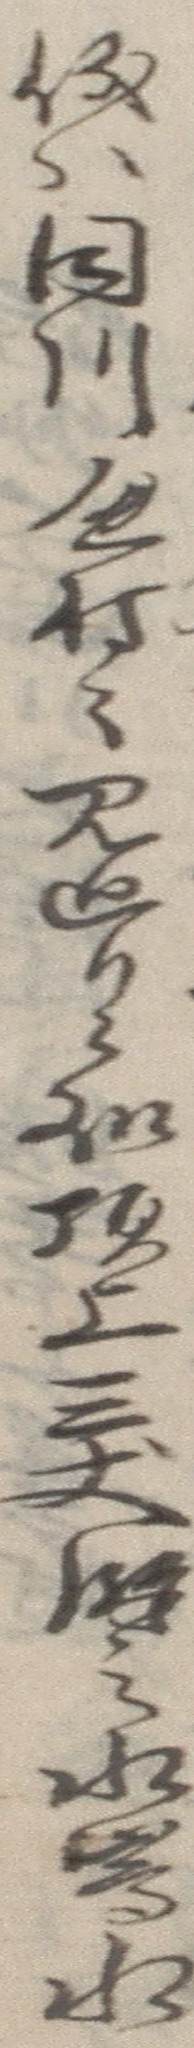儀ハ同川通村々見廻候処頂上三丈餘之水嵩水
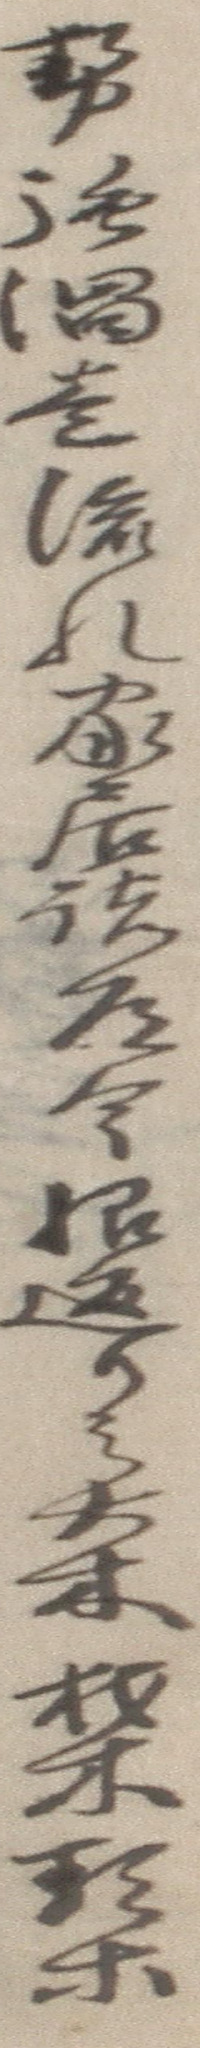勢強渦巻流れ家居諸道具根返り之大木材木類等
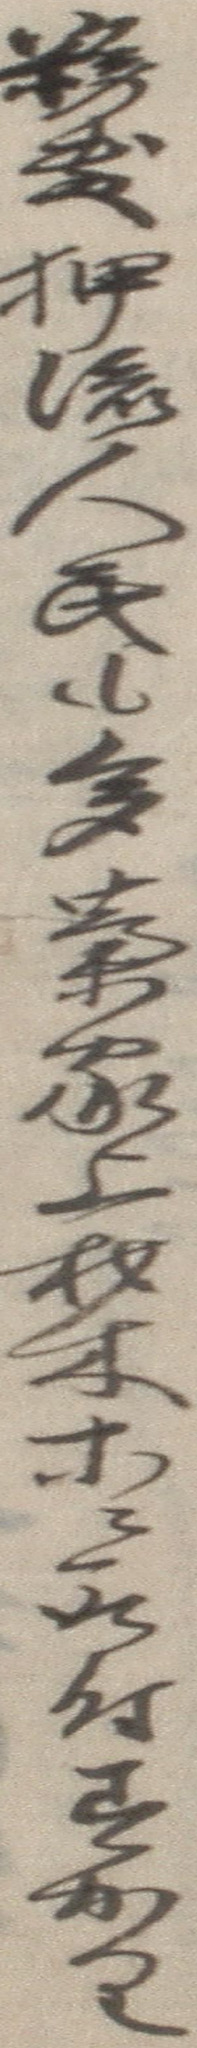夥敷押流人民も多藁家上材木等二取付すかり
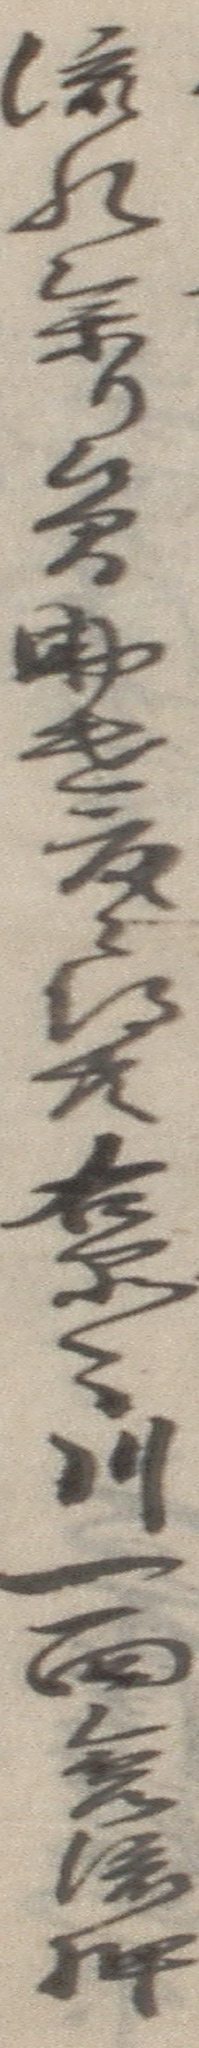流れ参り候間助遣度候得共右品々川一面急流押
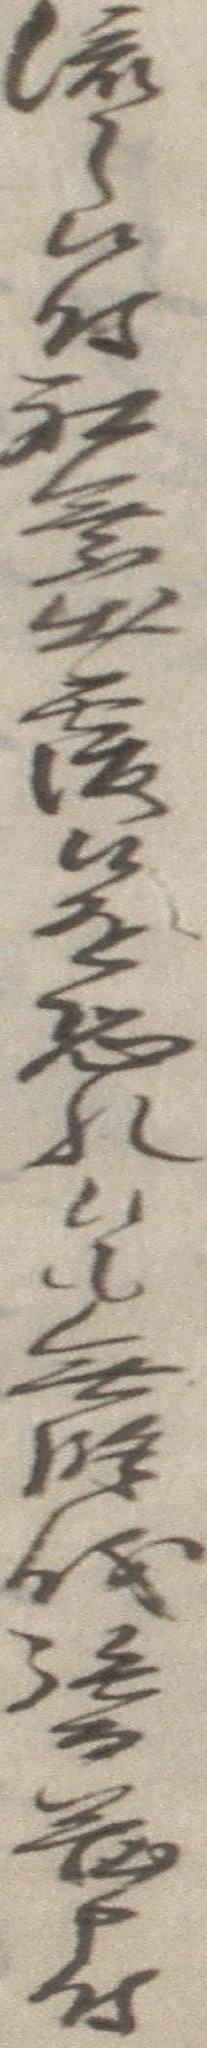流し候付船乗出覆候を恐れ候も無餘儀強而甚申付
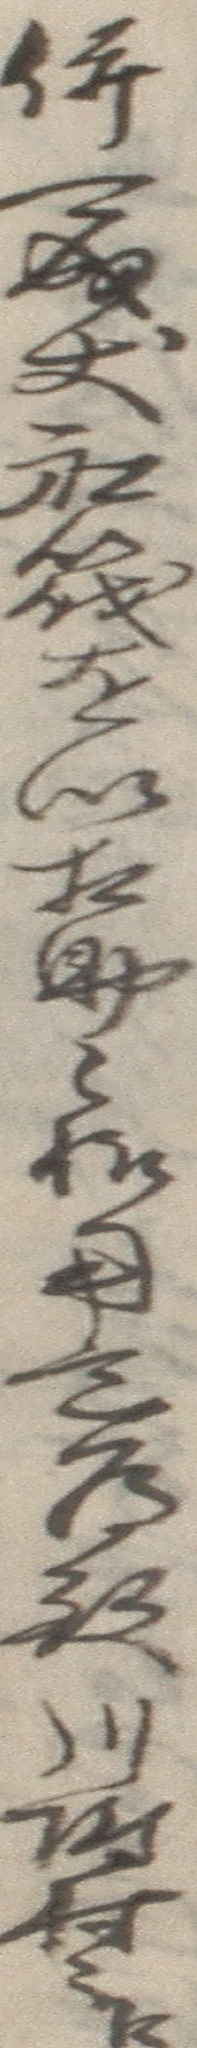併可成丈船筏を以相助候様用意為致川附村々江
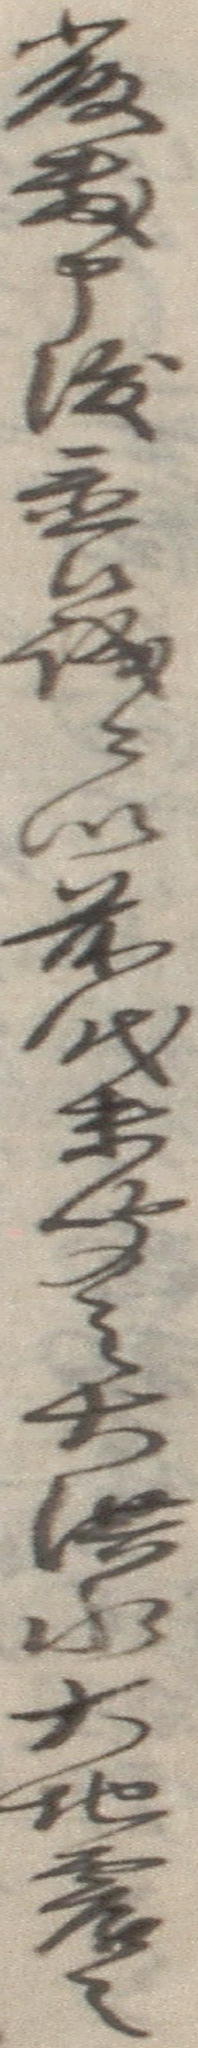厳敷申渡置候俄二以前代未聞之大洪水大地震之
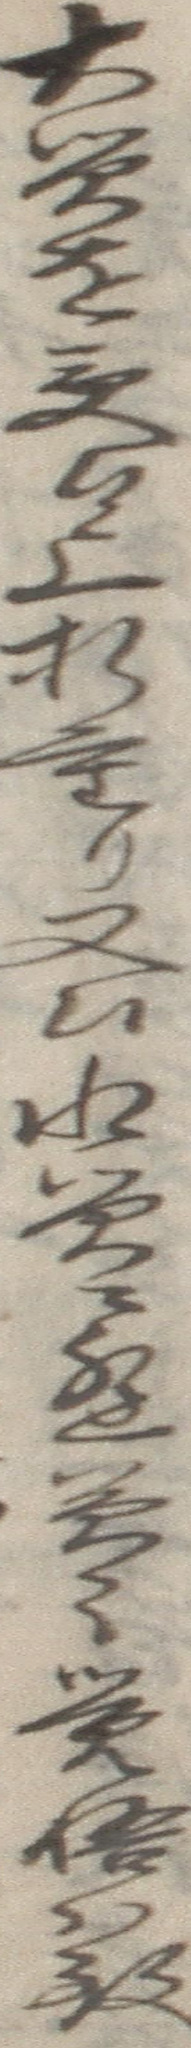大災を受候上折重り又候水災二逢兼々覚悟ハ致
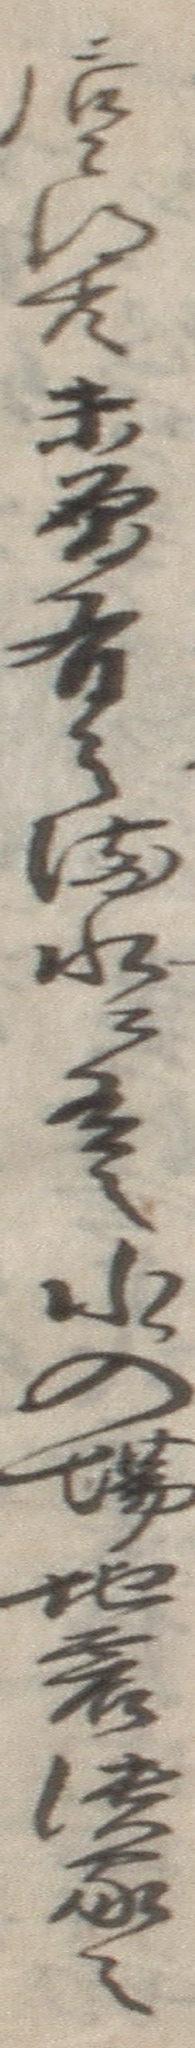居候得共未曾有之満水二有之水入場地震潰家之
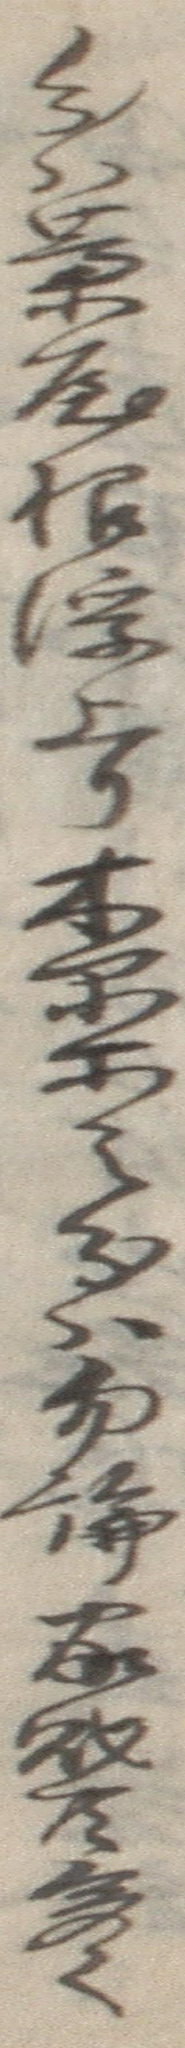分ハ藁屋根浮上り木品等之分ハ勿論家財共多く
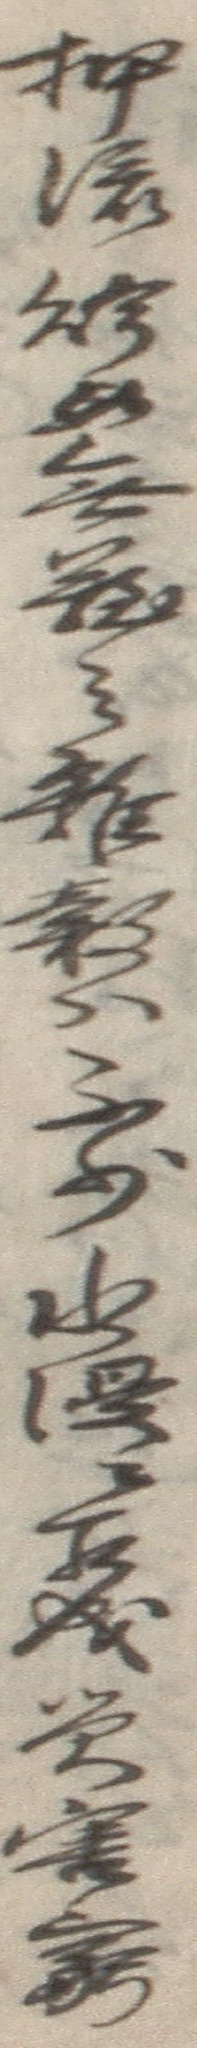押流貯候無難之雑穀ハ不少水浸二相成災害窮
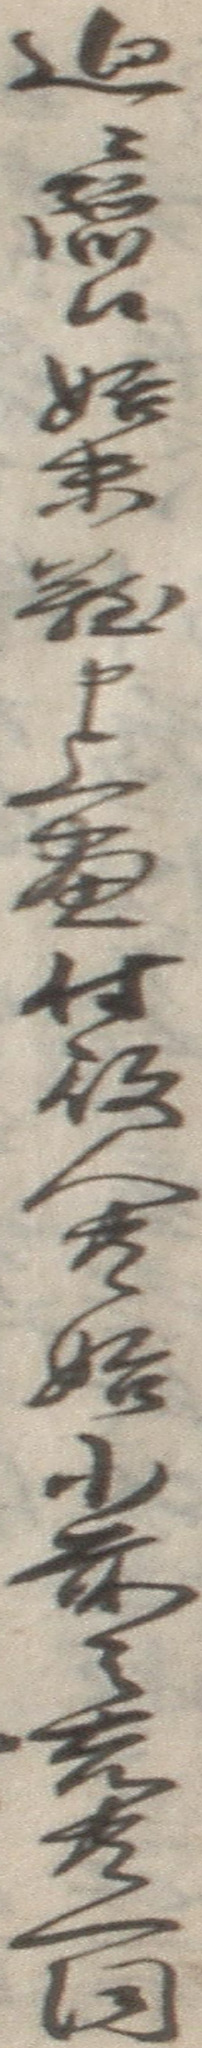迫二陥候始末難申上当村役人共始小前之者共一同
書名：信州地震一件
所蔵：東京大学地震研究所図書室 Earthquake Research Institute Library, The University of Tokyo, JAPAN
